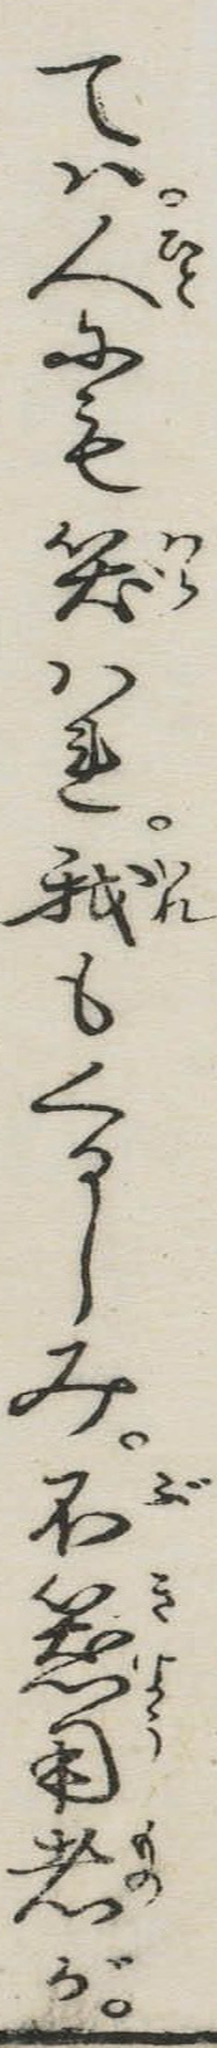ては。人にも笑はれ。我もくるしみ。不器用者が。

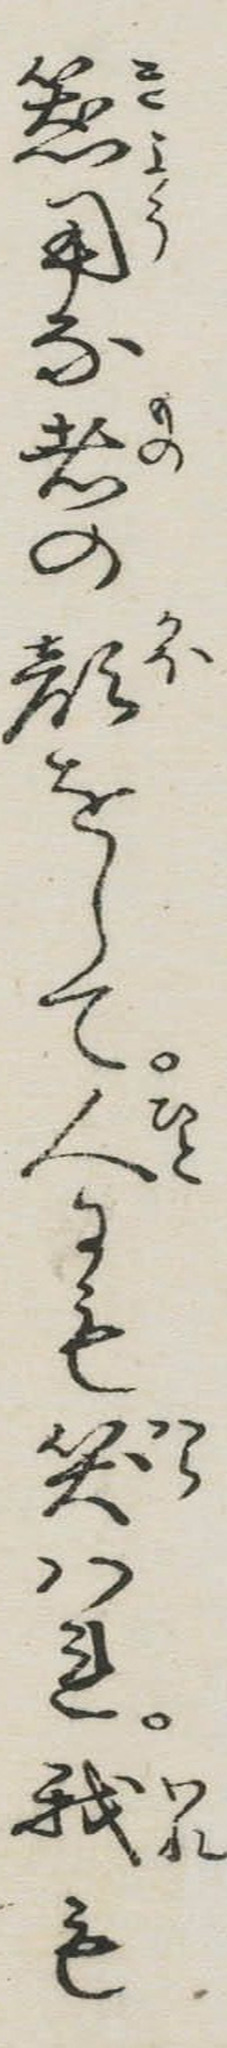器用な者の顔をして。人にも笑はれ。我も
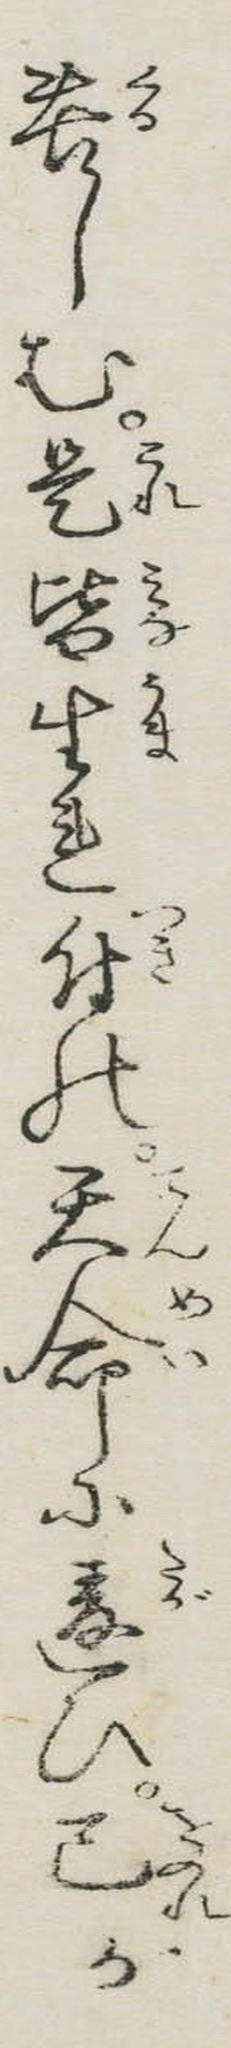苦しむ。是皆生れ付の。天命に違ひ。己が
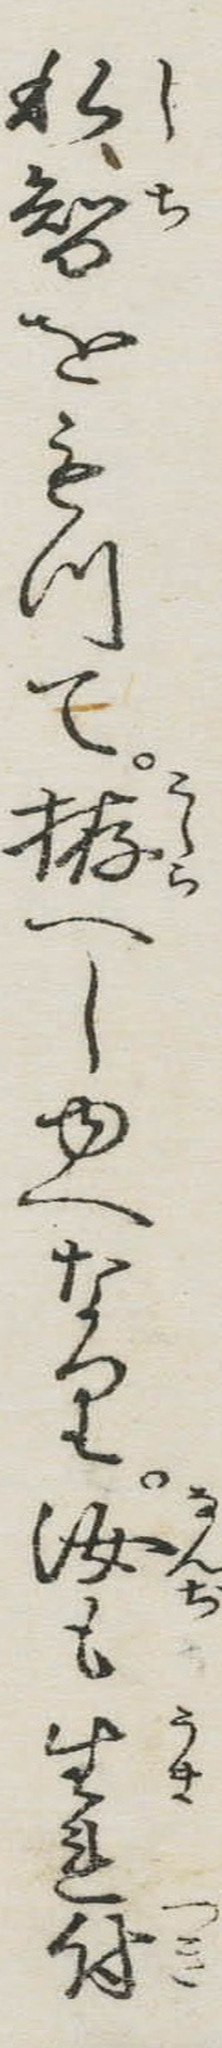私智をもつて。拵へしゆへなり。汝も生れ付
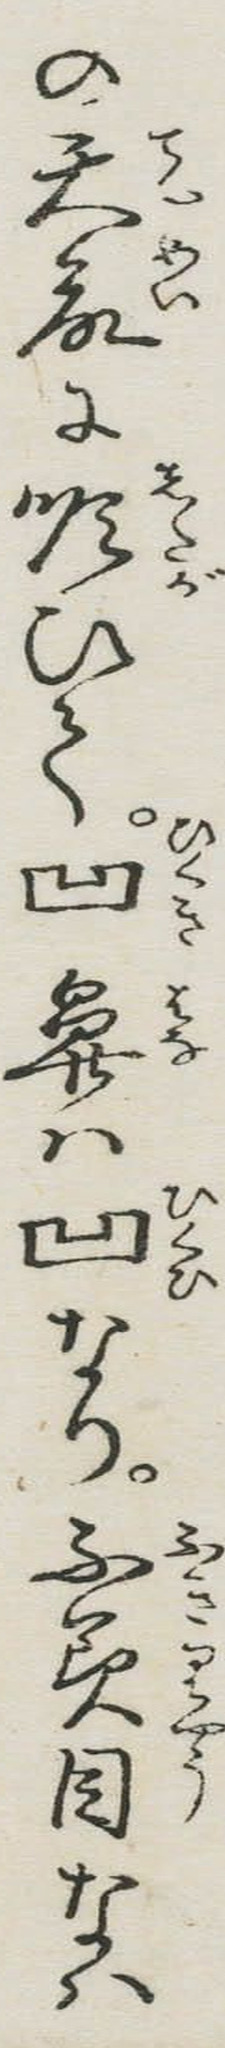の天命に順ひて。凹鼻は凹なり。不美目なは
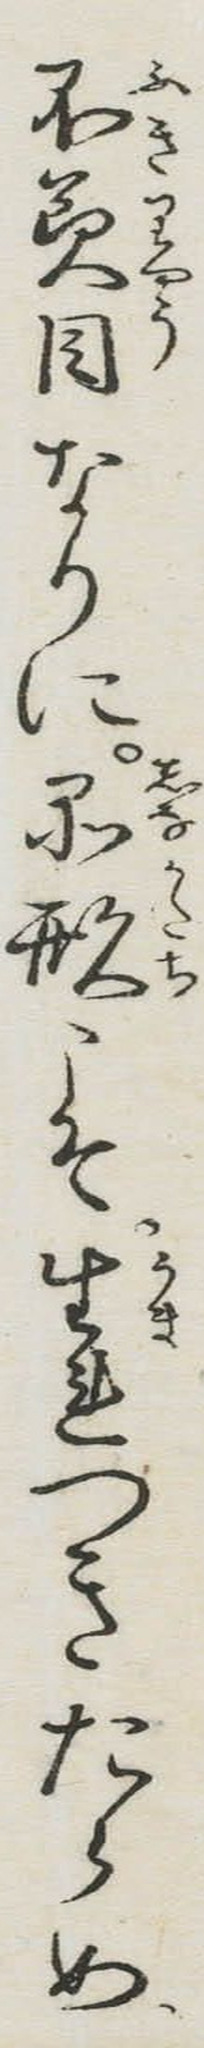不美目なりに。品形こそ。生れつきたらめ。
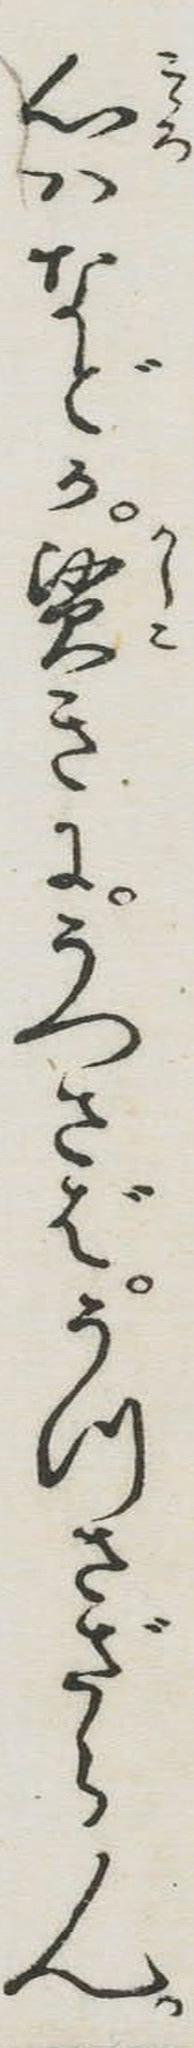心はなどか。賢きに。うつさば。うつさざらん。
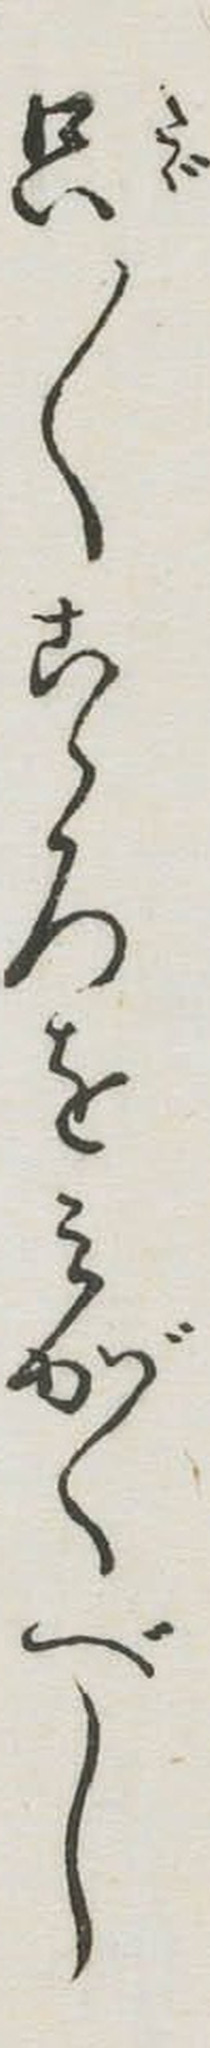只〳〵こゝろをみがくべし
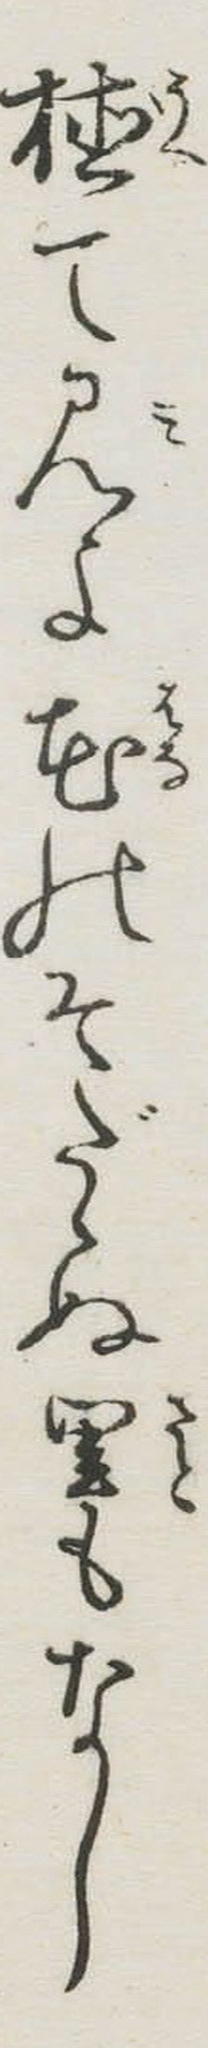植て見よ花のそだゝぬ里もなし
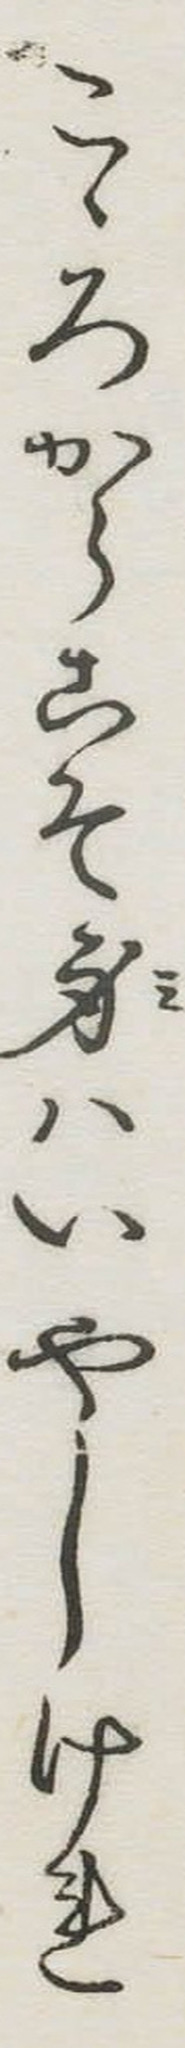こゝろからこそ身はいやしけれ
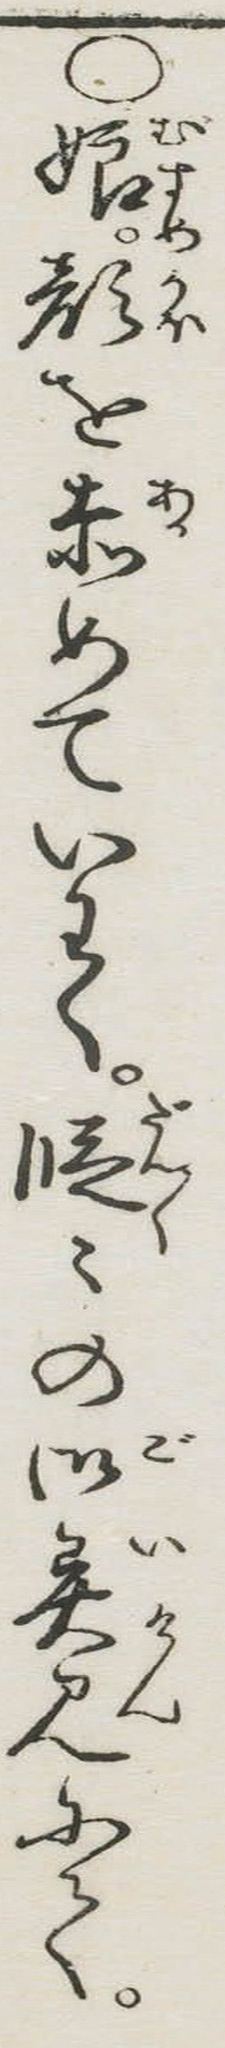○娘。顔を赤めていわく。段々の御異見にて。
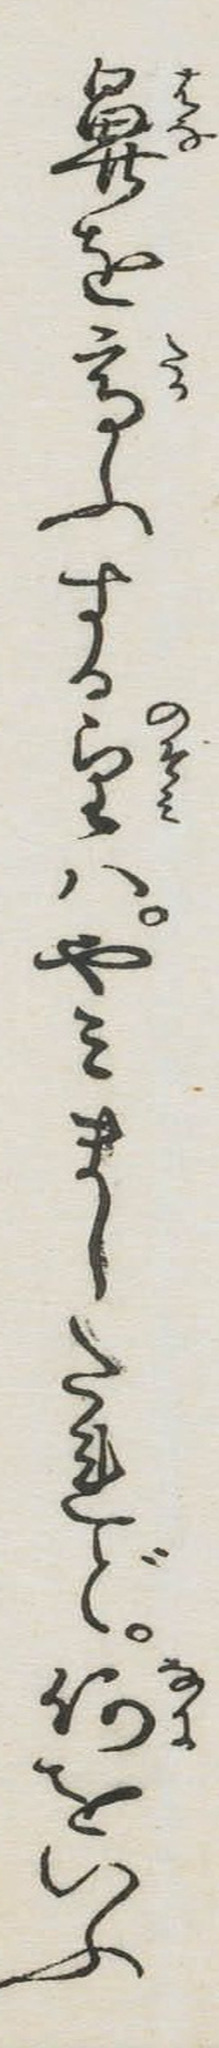鼻を高ふする望は。やみましたれど。何をいふ
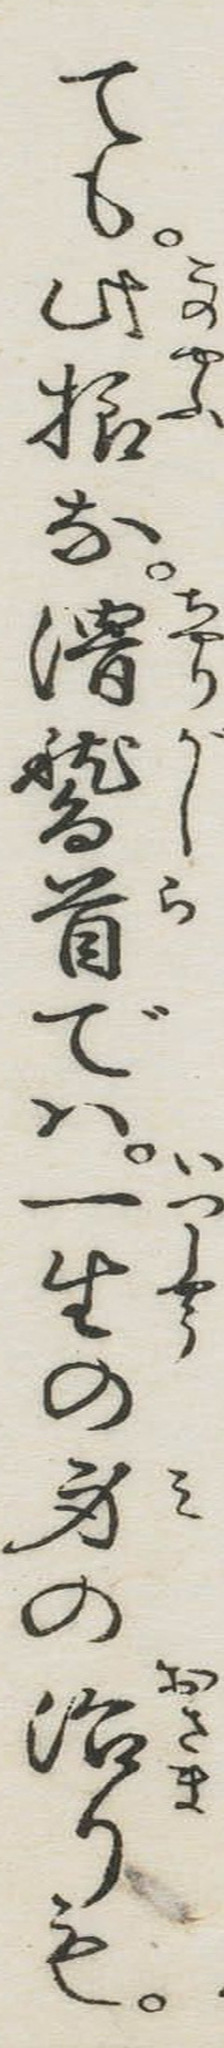ても。此様な。滑稽首では。一生の身の治りも。
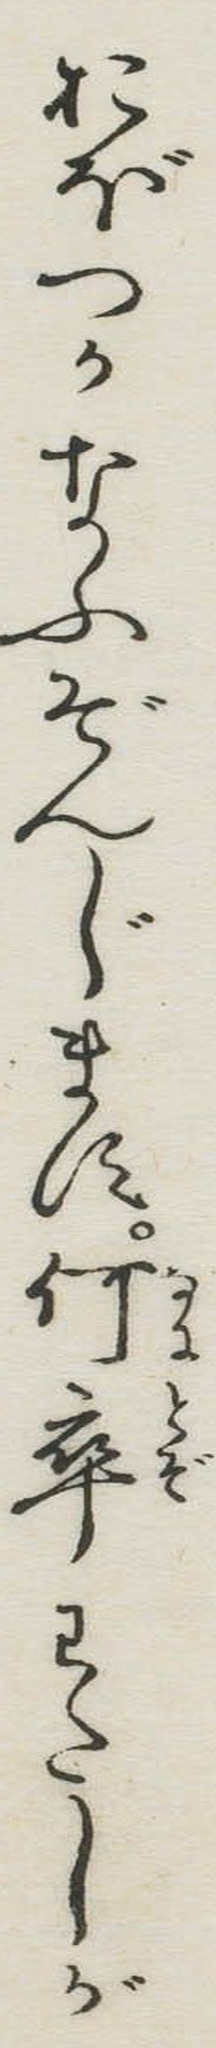おぼつかなふぞんじます。何卒わたしが
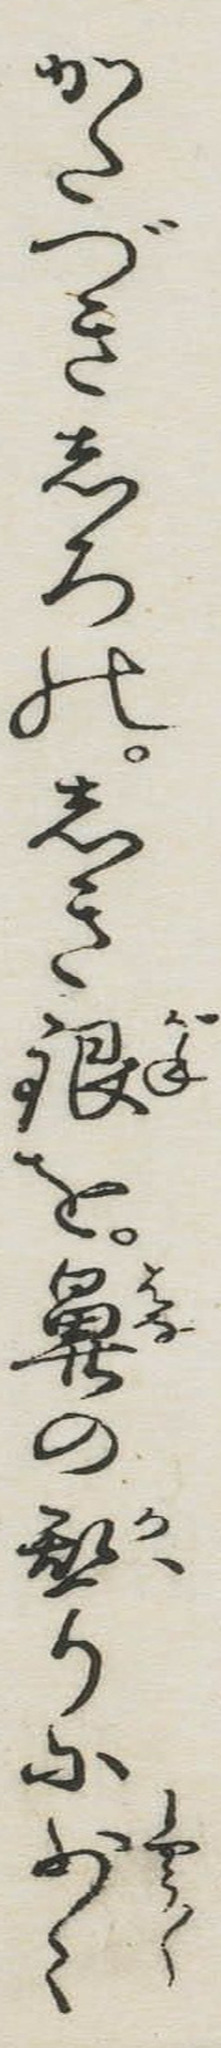かたづきしろの。しき銀を。鼻の替りに少々
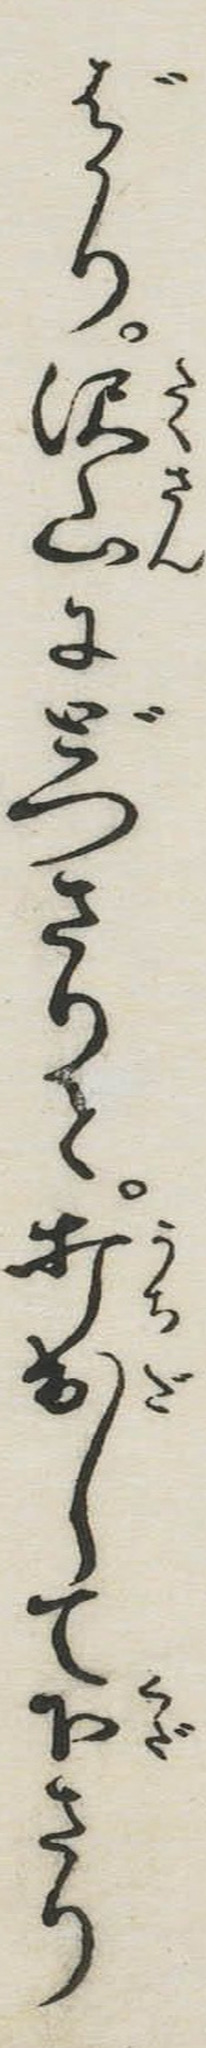ばかり。沢山にどつさりと。打出して下さり
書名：福神おしへの小槌 2巻 上
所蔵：東京学芸大学教育コンテンツアーカイブ
